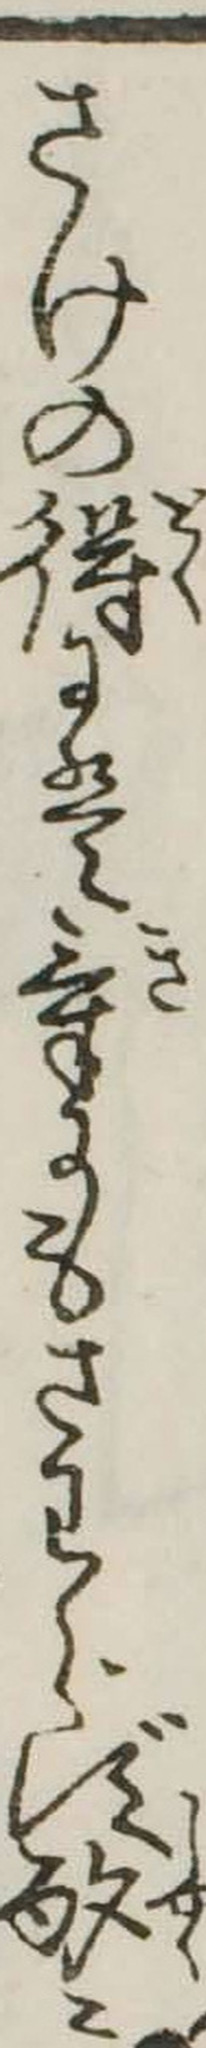さけの得には気にもさわらず酌に
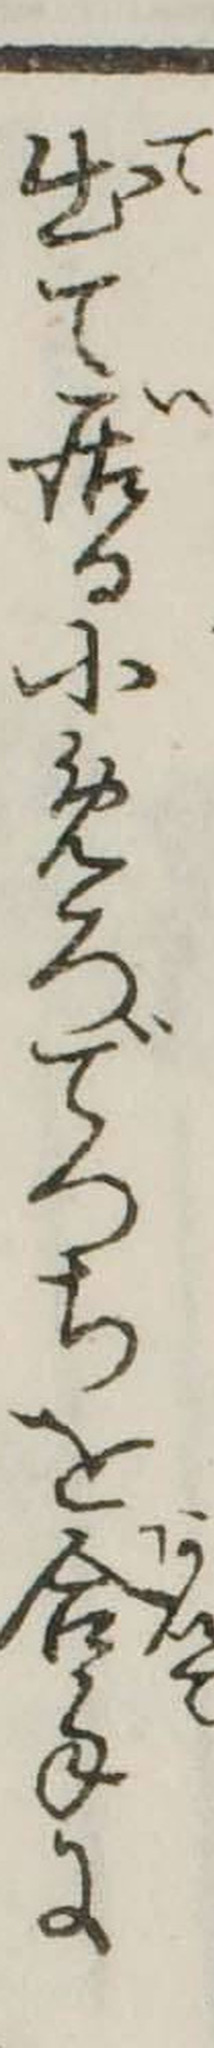出て居るにめろでつちを合手に
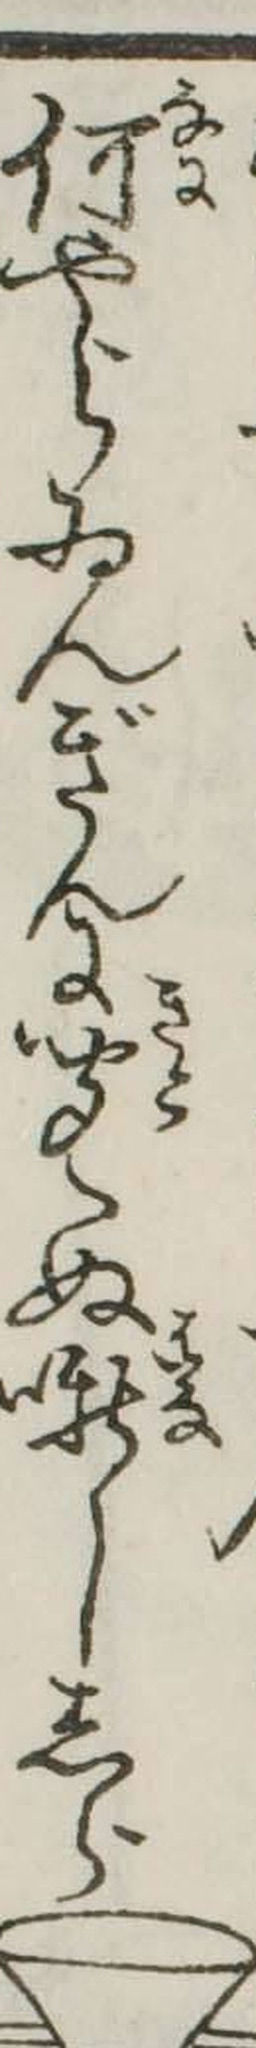何やらゐんぎんに聞ぬ噺ししら
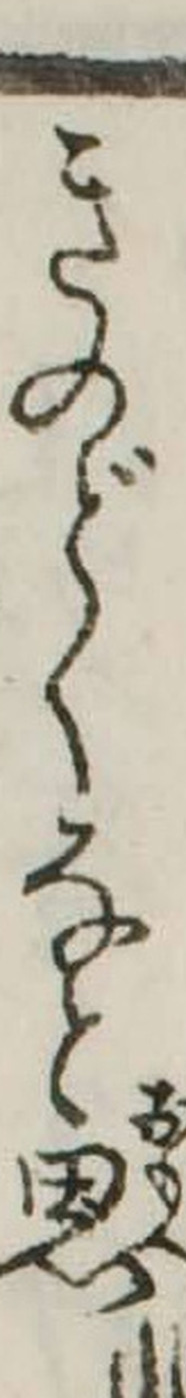きのどくなと思
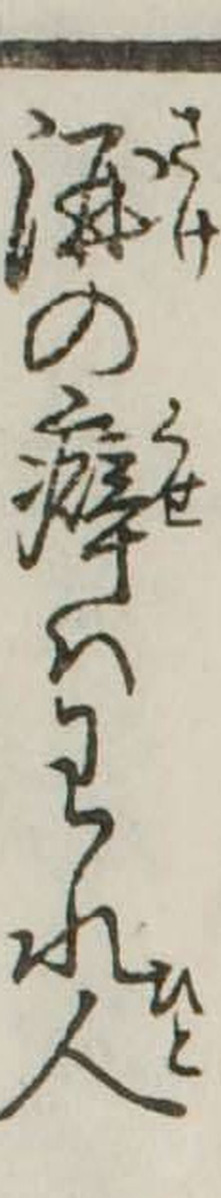酒の癖はわれ人
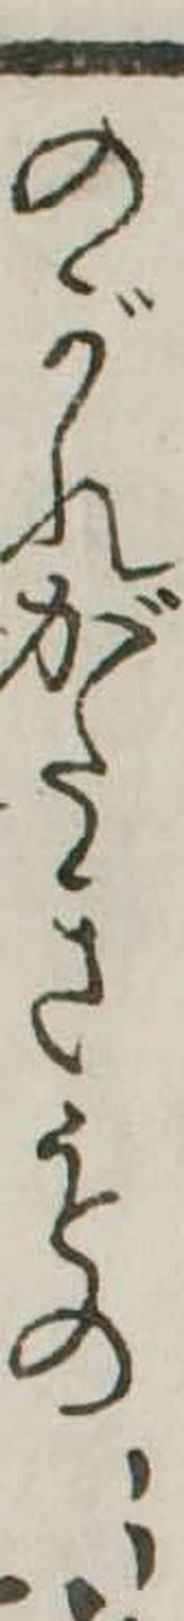のがれがたきもの
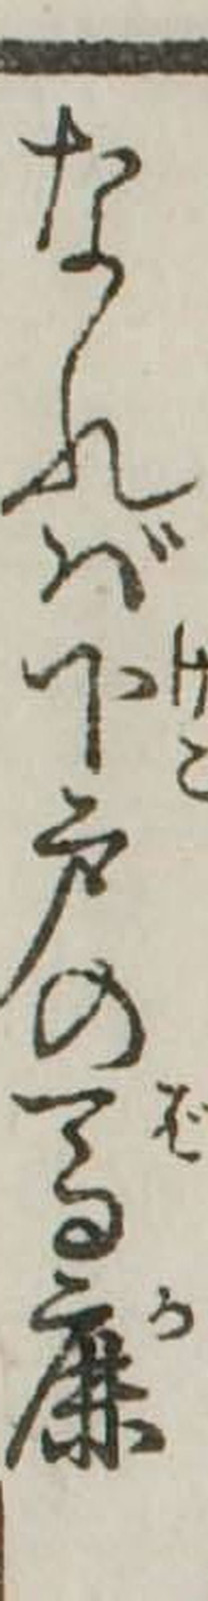なれば下戸の馬鹿
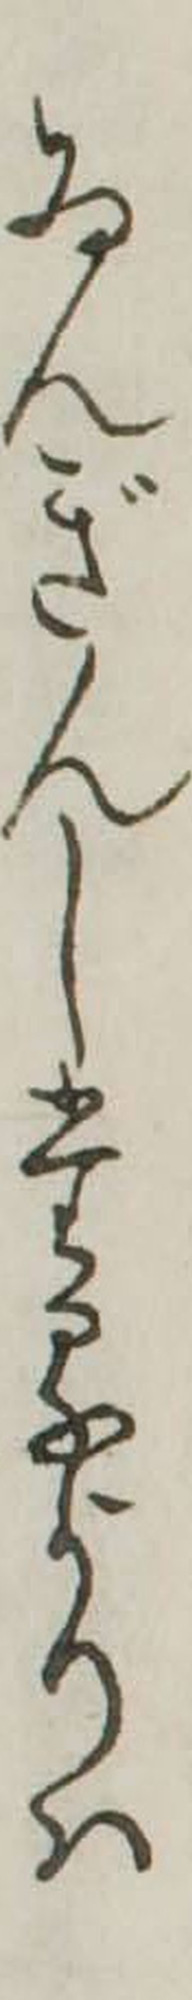ゐんぎんしたるよりは

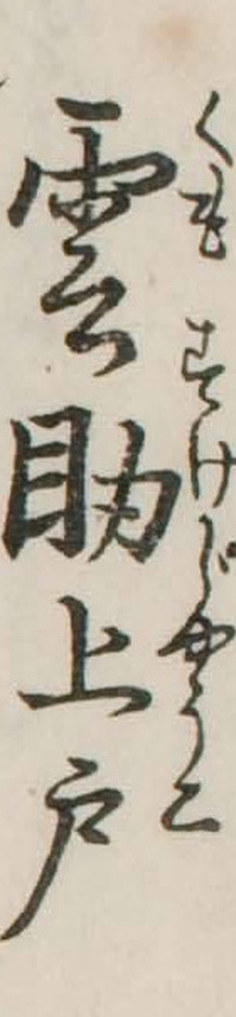雲助上戸
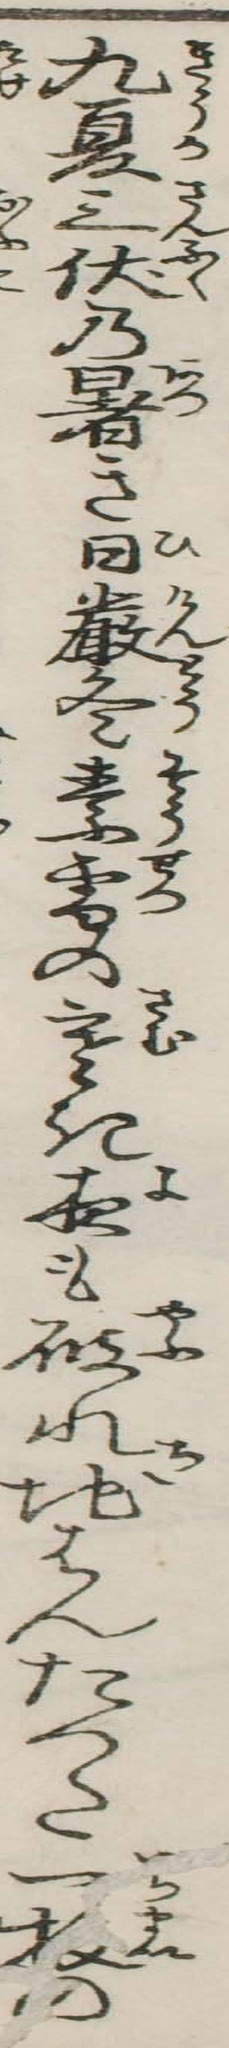九夏三伏の暑き日厳冬素雪の寒き夜も破れ地はんたつた一枚の
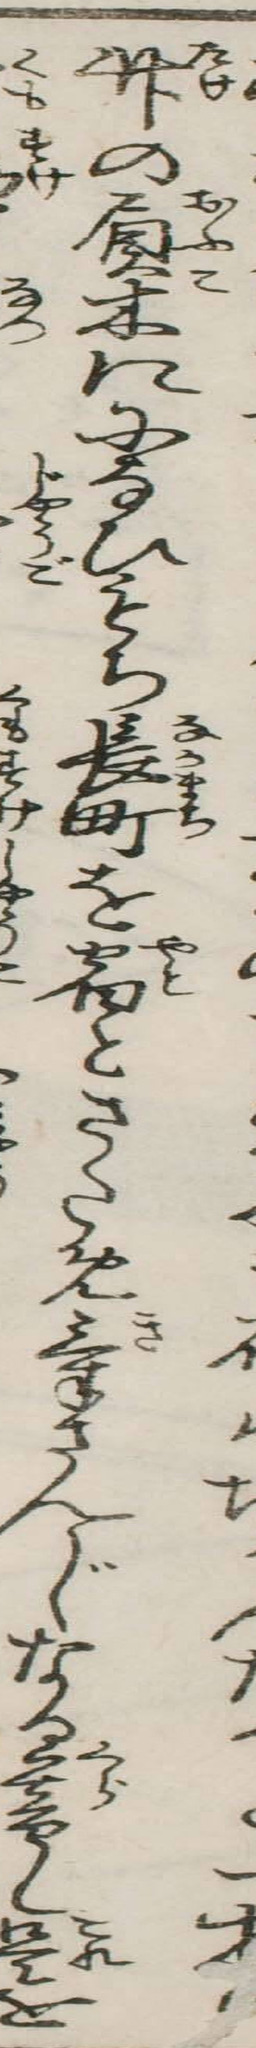竹の負木にになひもち長町を宿とさため気さんじなる暮し是を
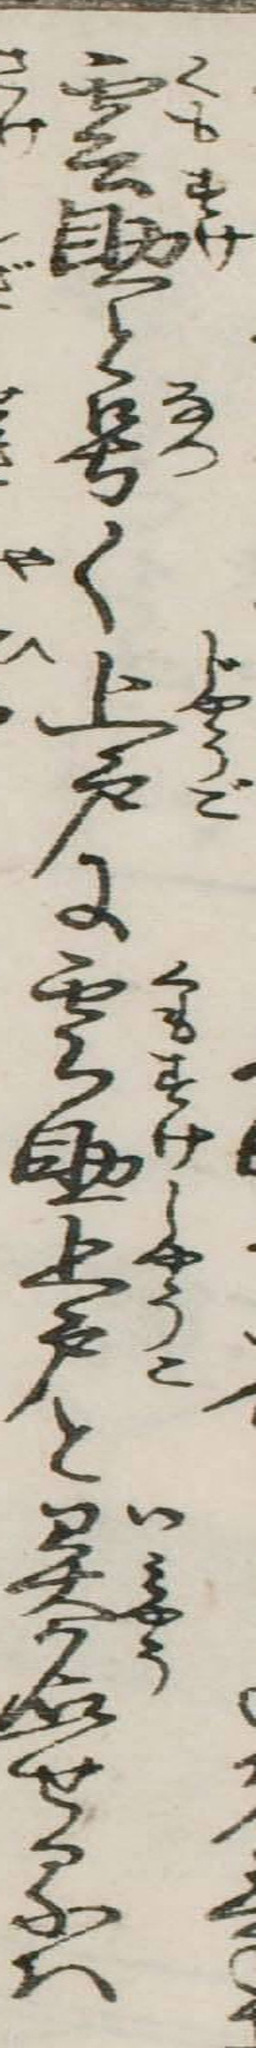雲助と号く上戸に雲助上戸と異名せるは
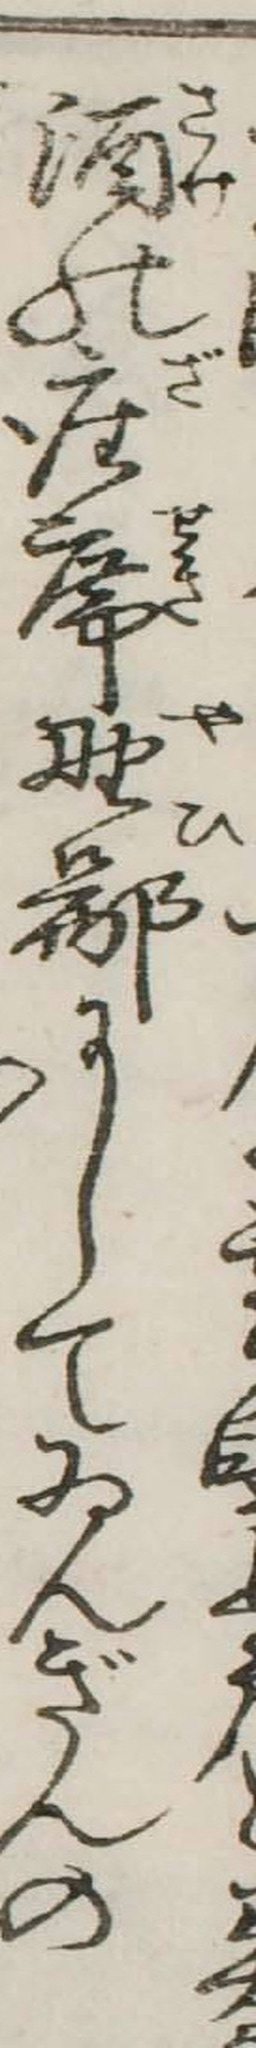酒の座席野鄙にしてゐんぎんの
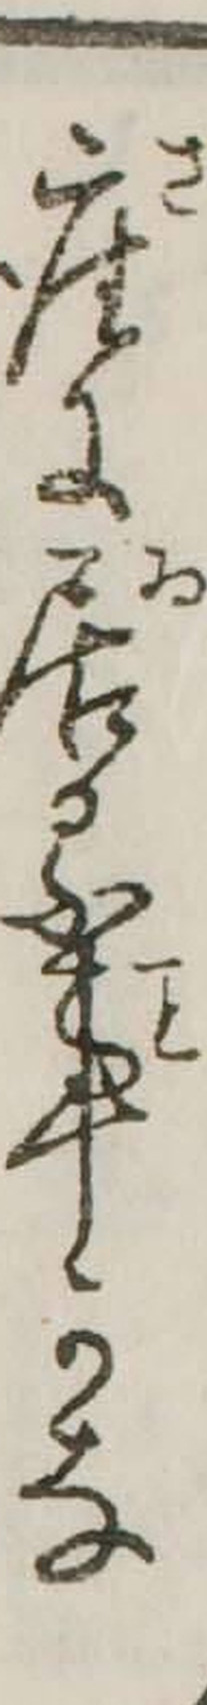座に居る事かな
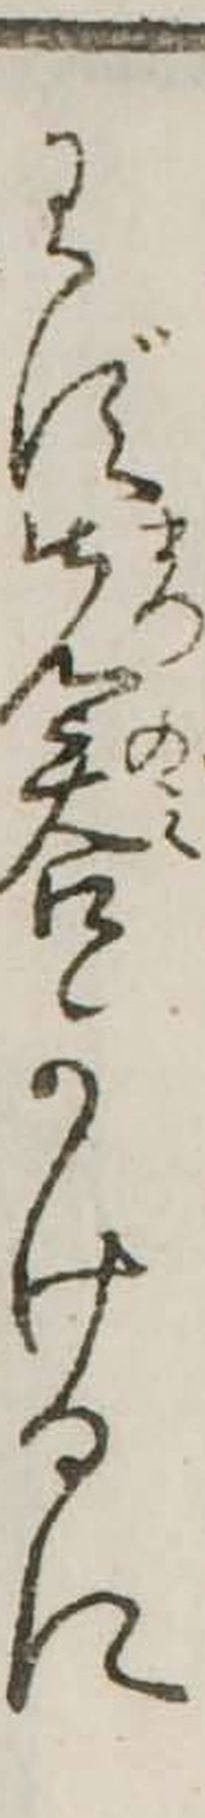わず先呑かけるに
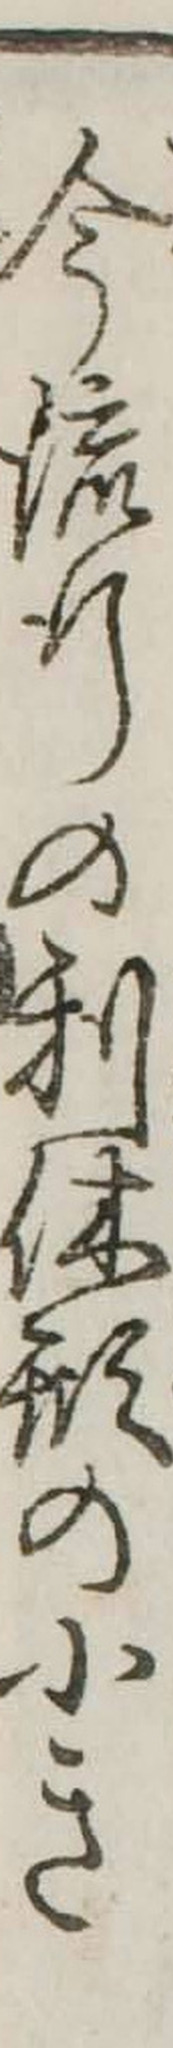今流行の利休形の小き
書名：繪本不盡泉
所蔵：国文学研究資料館
